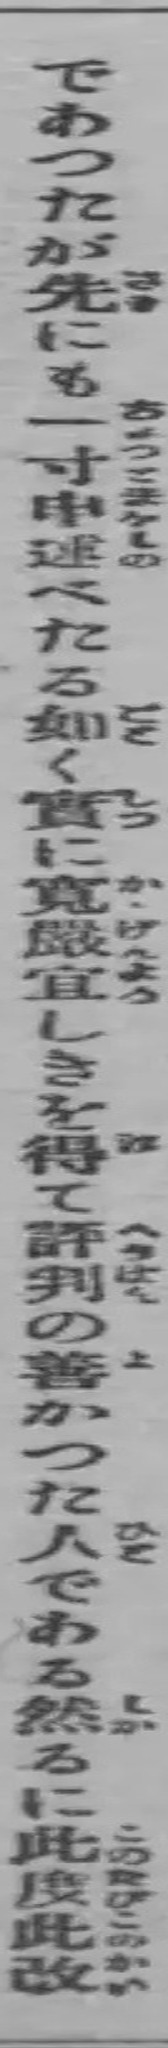であつたが先にも一寸申述べたる如く実に寛厳宜しきを得て評判の善かつた人である然るに此度此改
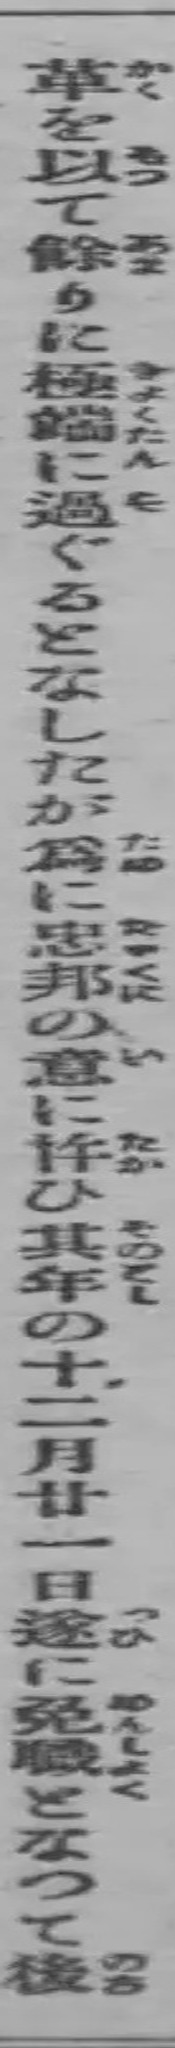革を以て余りに極端に過ぐるとなしたが為に忠邦の意に忤ひ其年の十二月廿一日遂に免職となつて後
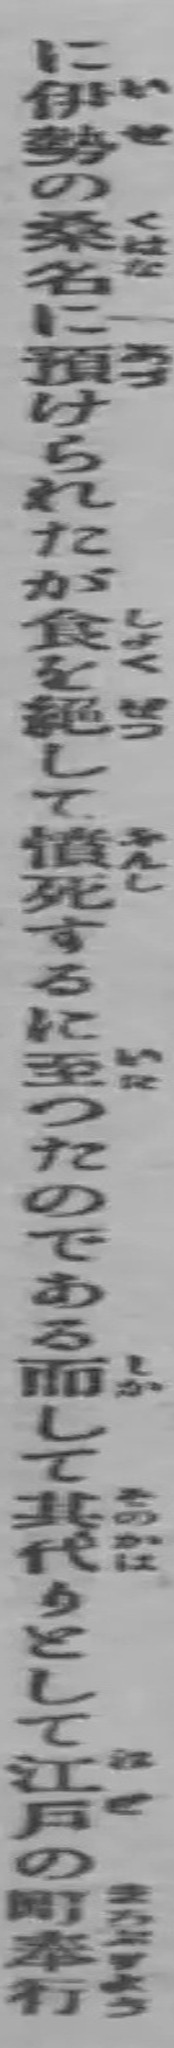に伊勢の桑名に預けられたが食を絶して憤死するに至つたのである而して其代りとして江戸の町奉行
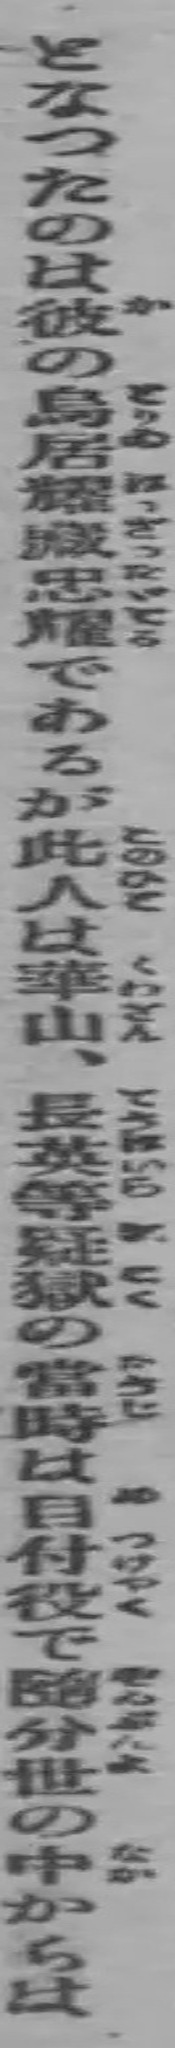鳥居忠耀となつたのは彼の鳥居耀蔵忠耀であるが此人は崋山、長英等疑獄の当時は目付役で随分世の中からは

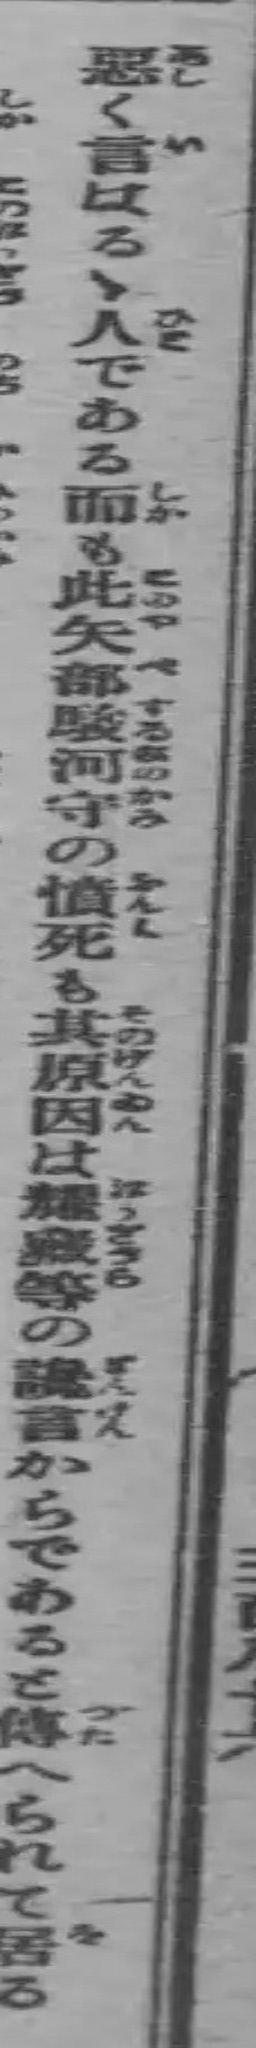悪く言はるゝ人である而も此矢部駿河守の憤死も其原因は耀蔵等の讒言からであると伝へられて居る
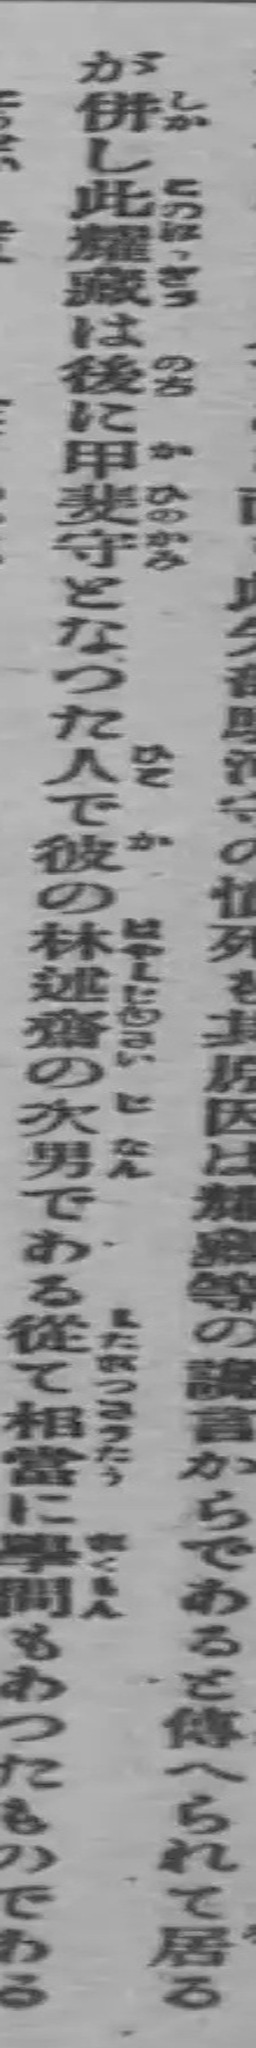が併し此耀蔵は後に甲斐守となつた人で彼の林述斉の次男である従て相当に学問もあつたものである
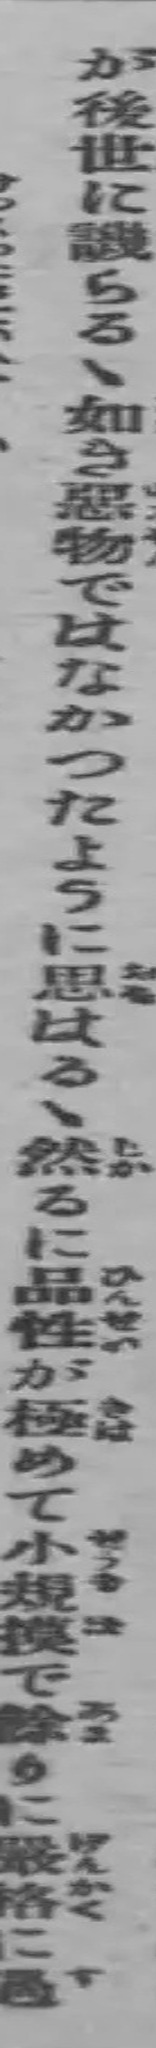が後世に譏らるゝ如き悪者ではなかつたように思はるゝ然るに品性が極めて小規模で余りに厳格に過
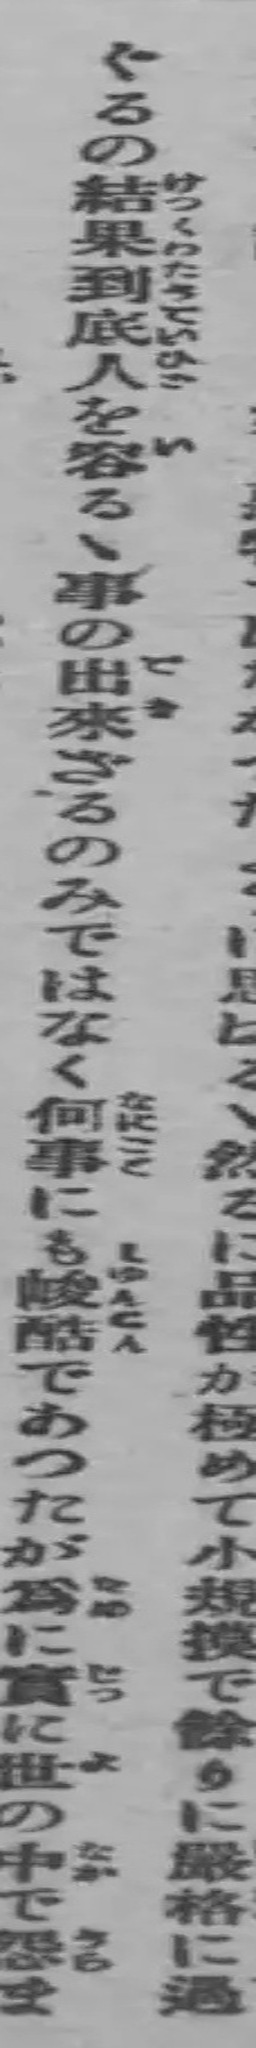ぐるの結果到底人を容るゝ事の出来ざるのみではなく何事にも峻酷であつたが為に実に世の中で怨ま
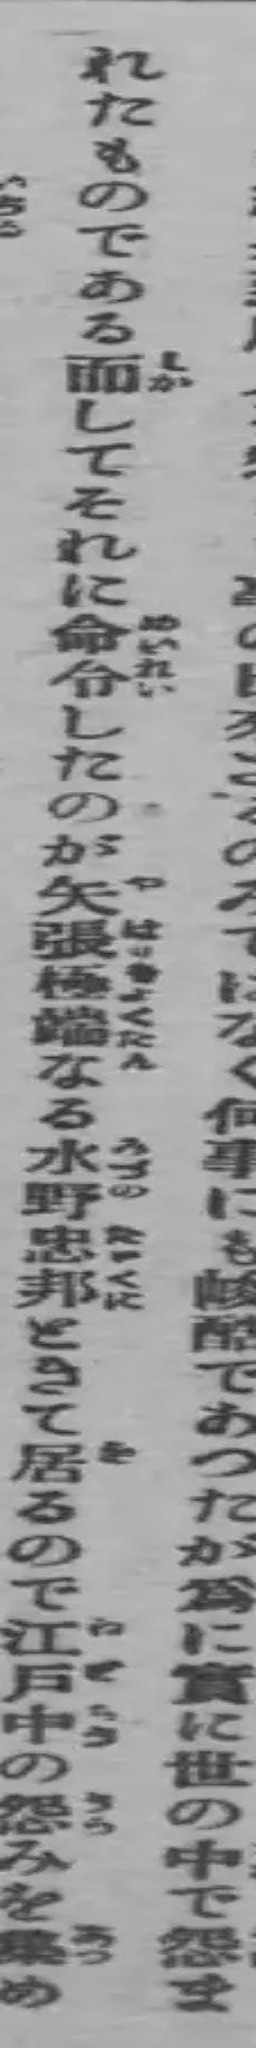れたものである而してそれに命令したのが矢張極端なる水野忠邦ときて居るので江戸中の怨みを集め
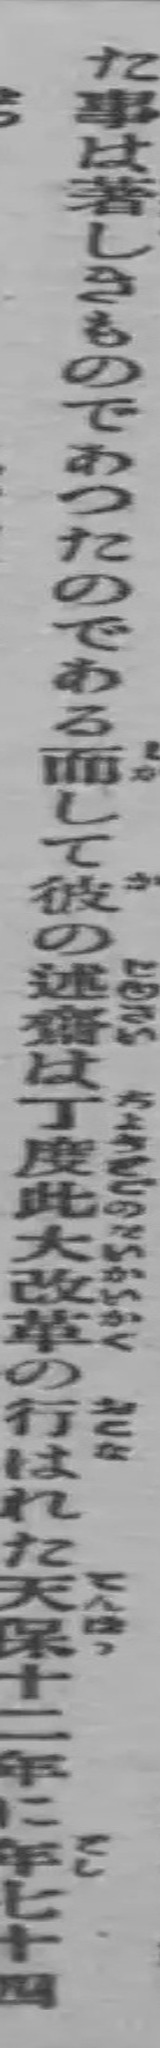た事は著しきものであつたのである而して彼の述斉は丁度此大改革の行はれた天保十二年に年七十四
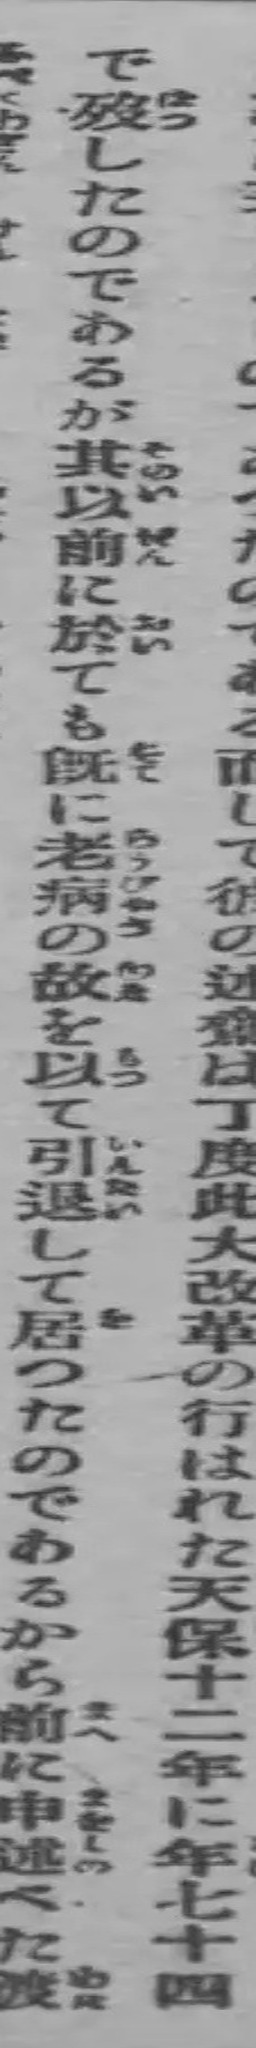で歿したのであるが其以前に於ても既に老病の故を以て引退して居つたのであるから前に申述べた渡
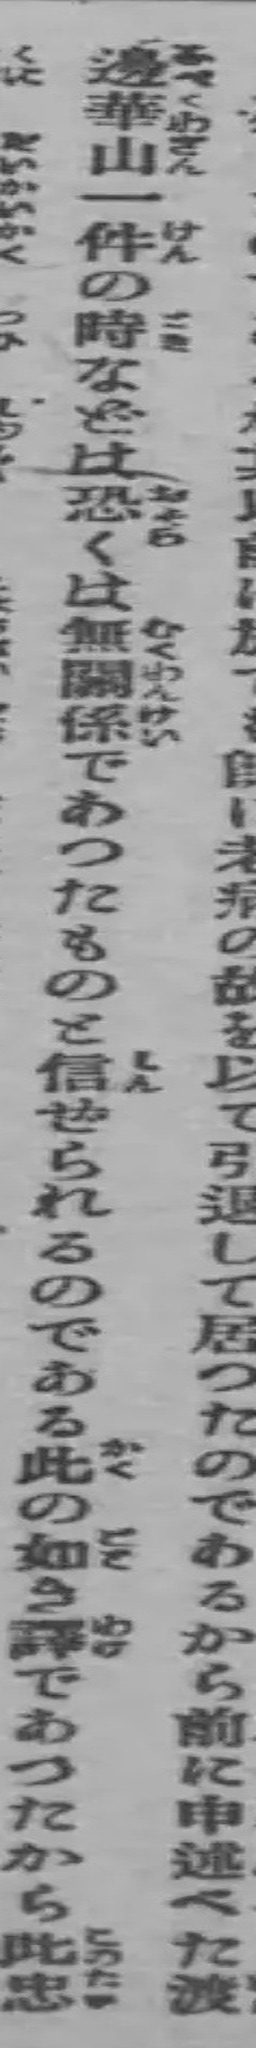忠邦の失敗辺崋山一件の時などは恐くは無関係であつたものと信ぜられるのである此の如き訳であつたから此忠
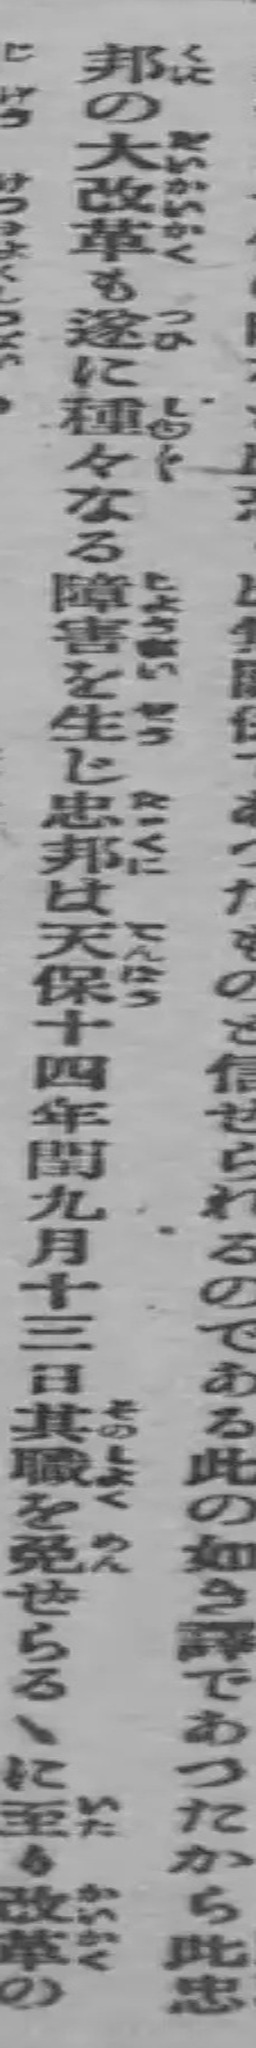邦の大改革も遂に種々なる障害を生じ忠邦は天保十四年閏九月十三日其職を免ぜらるゝに至り改革の
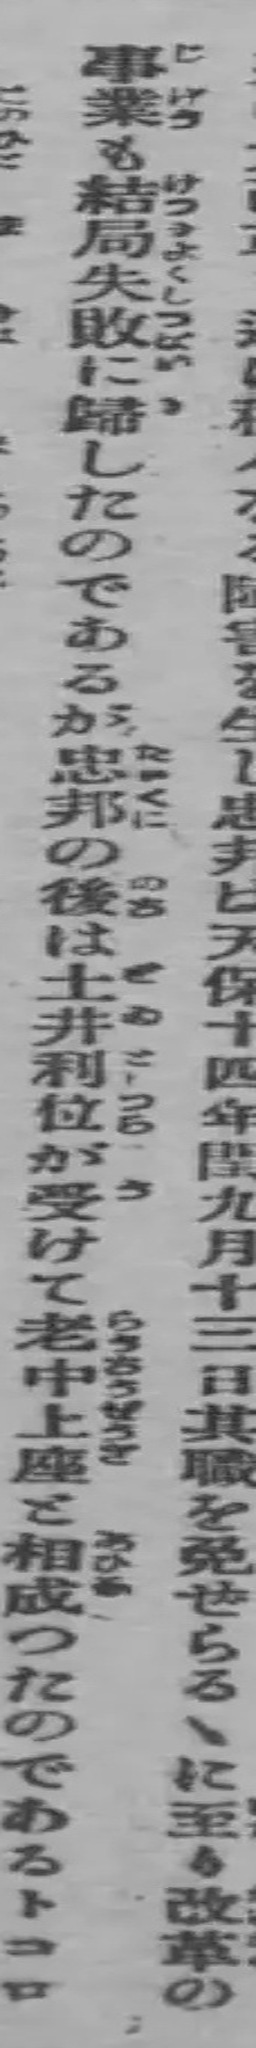事業も結局失敗に帰したのであるが忠邦の後は土井利位が受けて老中上座と相成つたのであるトコロ
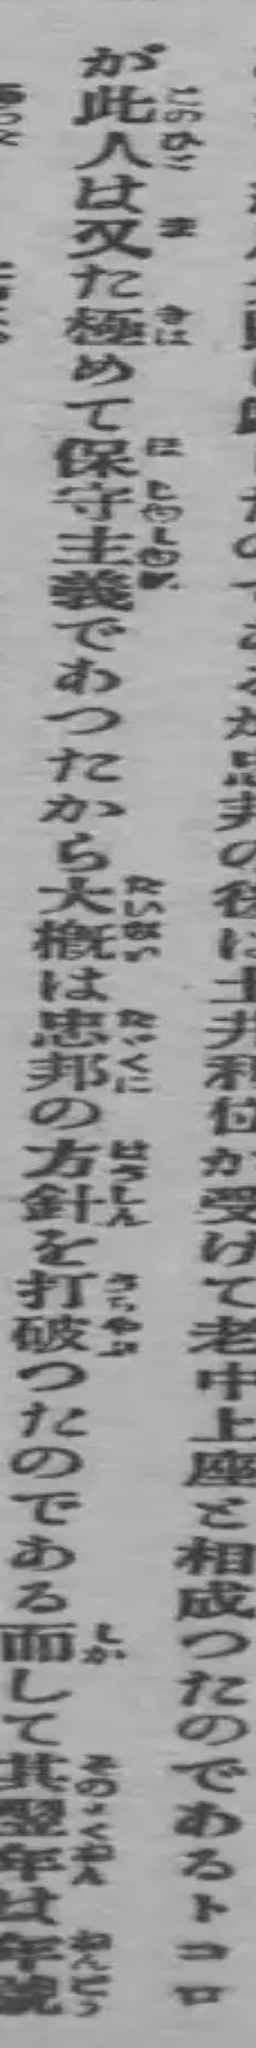が此人は又た極めて保守主義であつたから大概は忠邦の方針を打破つたのである而して其翌年は年号
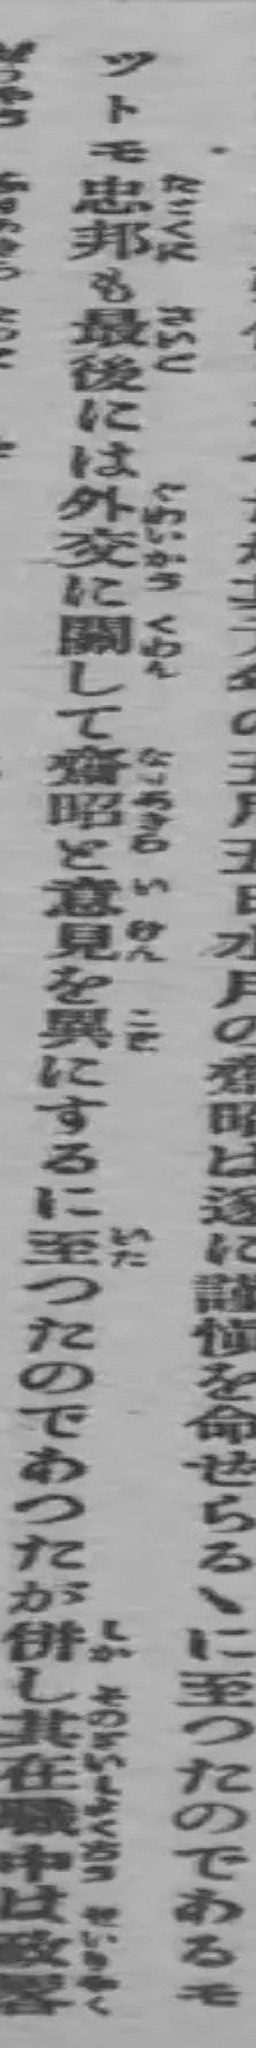ツトモ忠邦も最後には外交に関して斉昭と意見を異にするに至つたのであつたが併し其在職中は政略
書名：豊橋市史談
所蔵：国立国会図書館 National Diet Library, JAPAN
